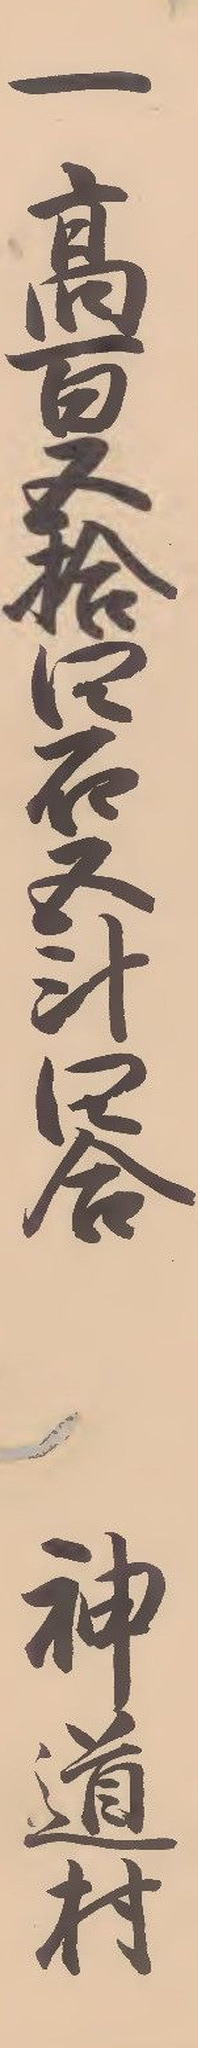一高百五拾四石五斗四合神道村

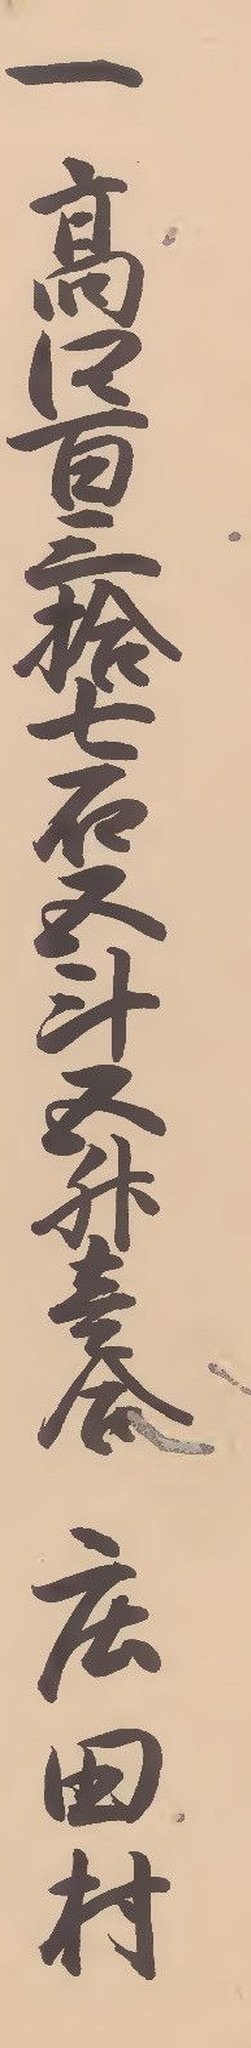一高四百三拾七石五斗五升壱合庄田村
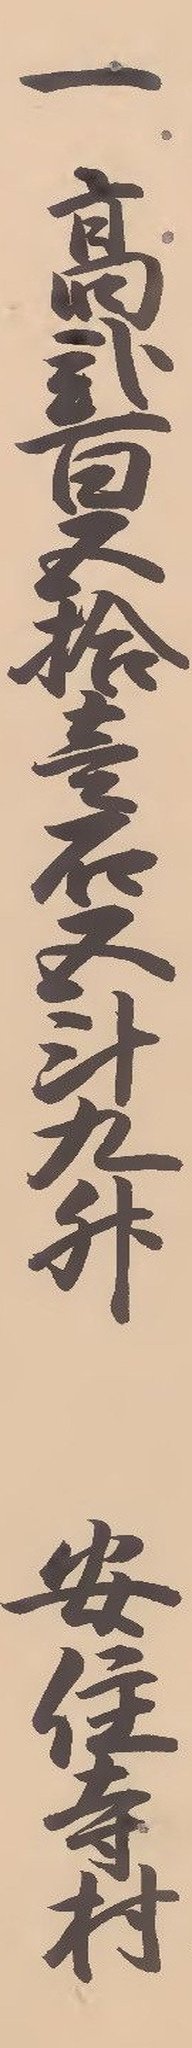一高弐百五拾壱石五斗九升安住寺村
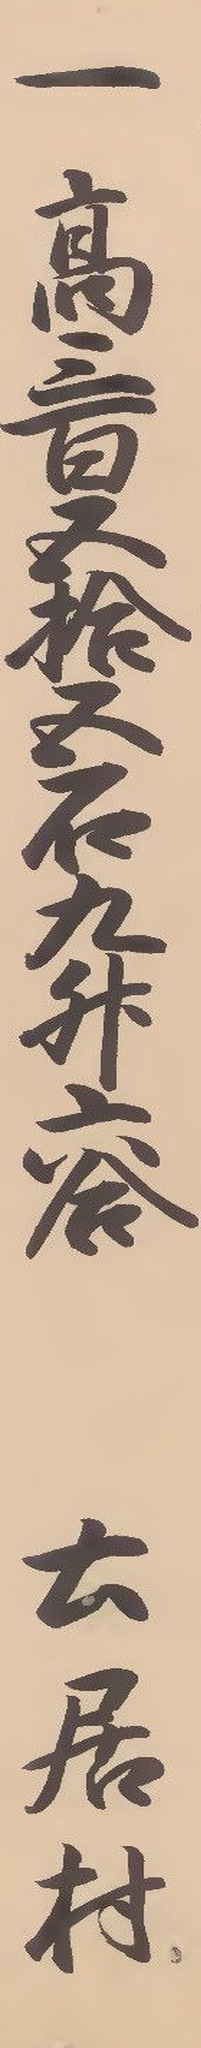一高三百五拾五石九升六合土居村
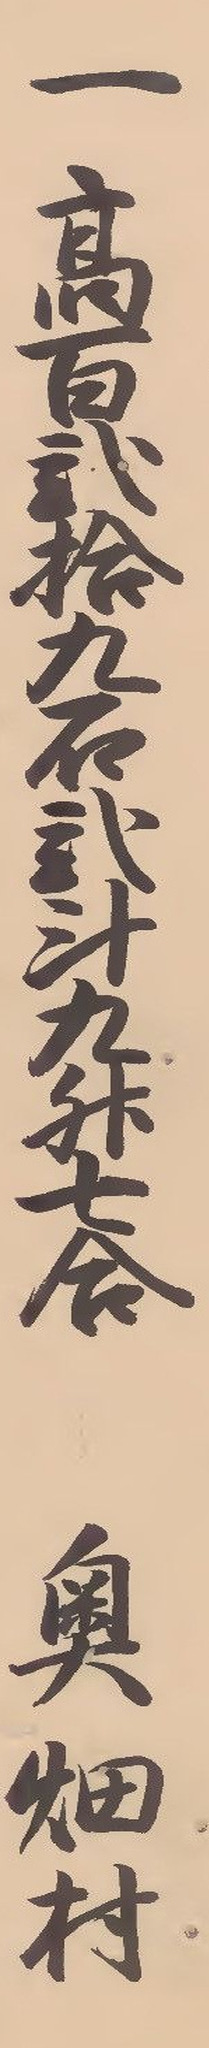一高百弐拾九石弐斗九升七合奥畑村
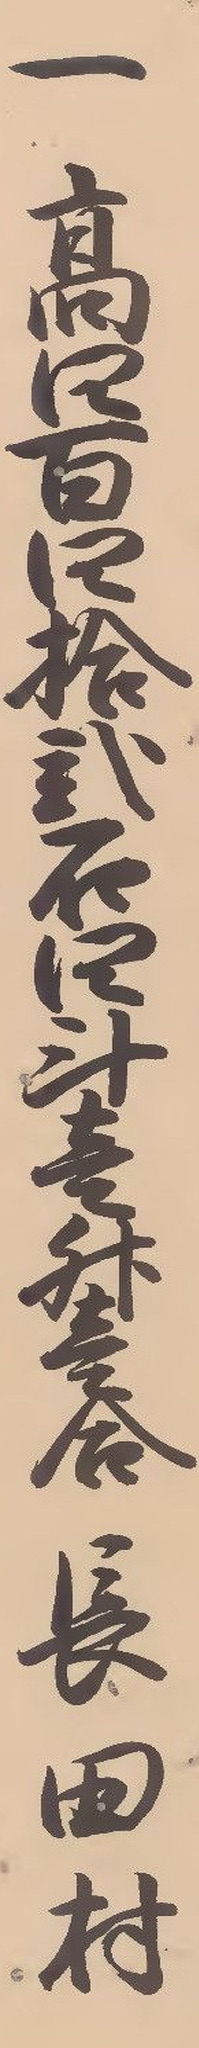一高四百四拾弐石四斗壱升壱合長田村
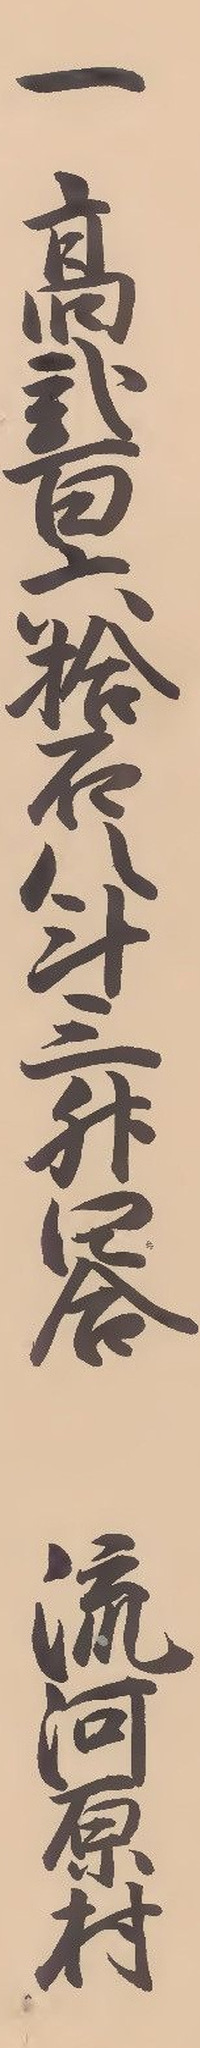一高弐百六拾石八斗三升四合流河原村
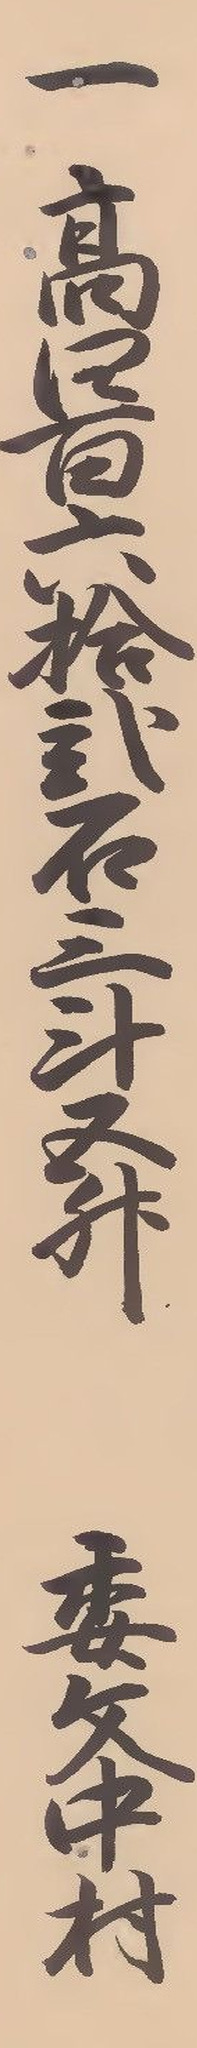一高四百六拾弐石三斗五升委文中村
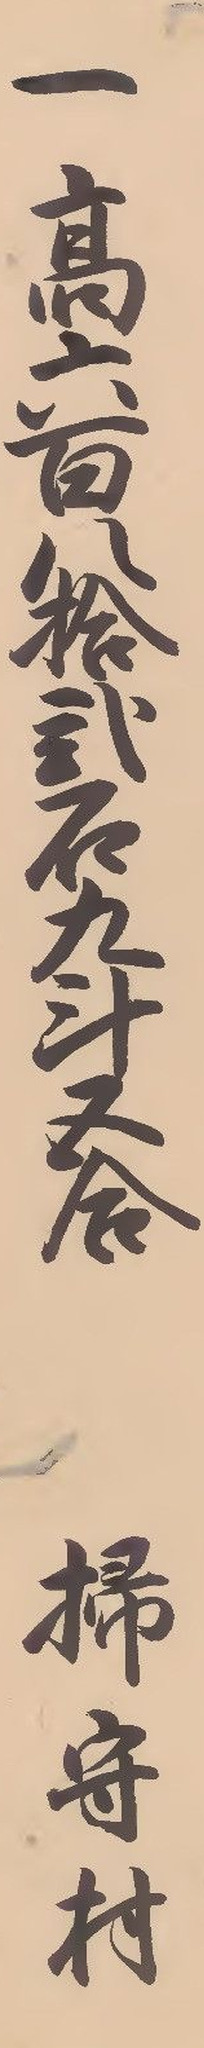一高六百八拾弐石九斗五合掃守村

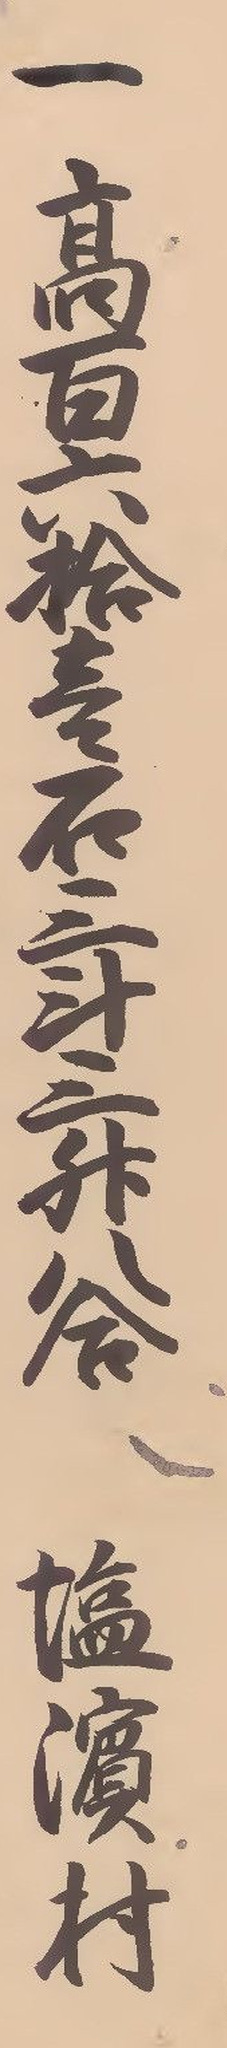一高百六拾壱石三斗三升八合塩浜村
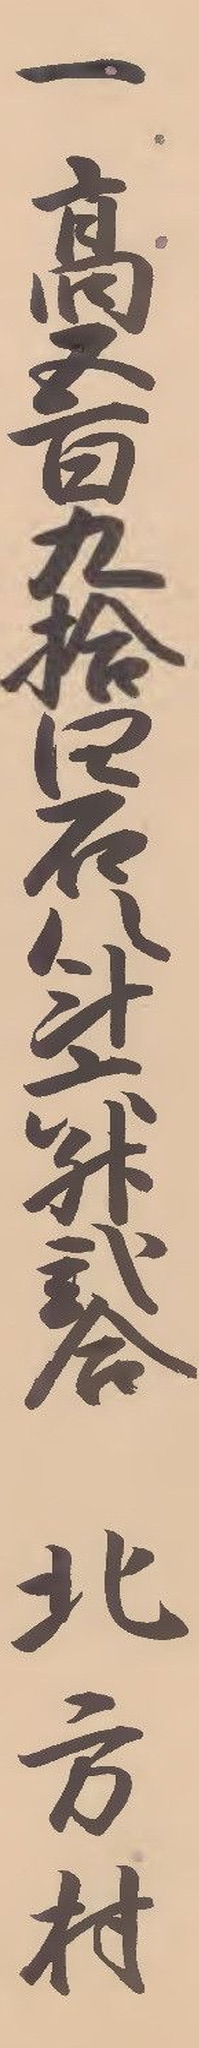一高五百九拾四石八斗六升弐合北方村
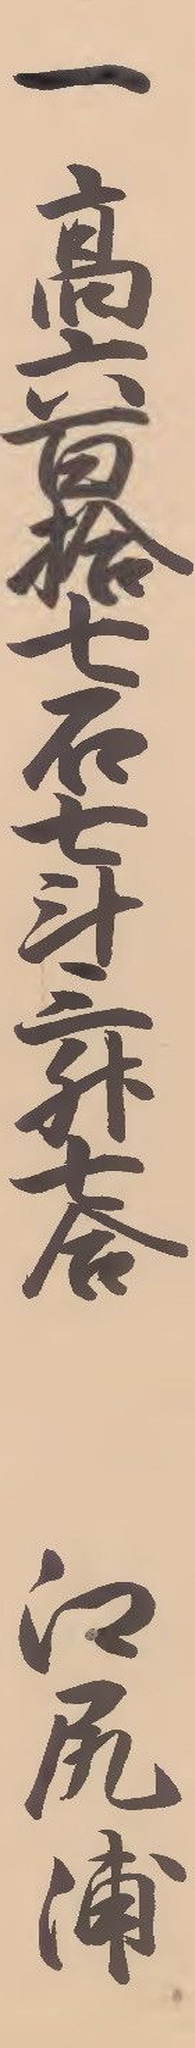一高六百拾七石七斗三升七合江尻浦
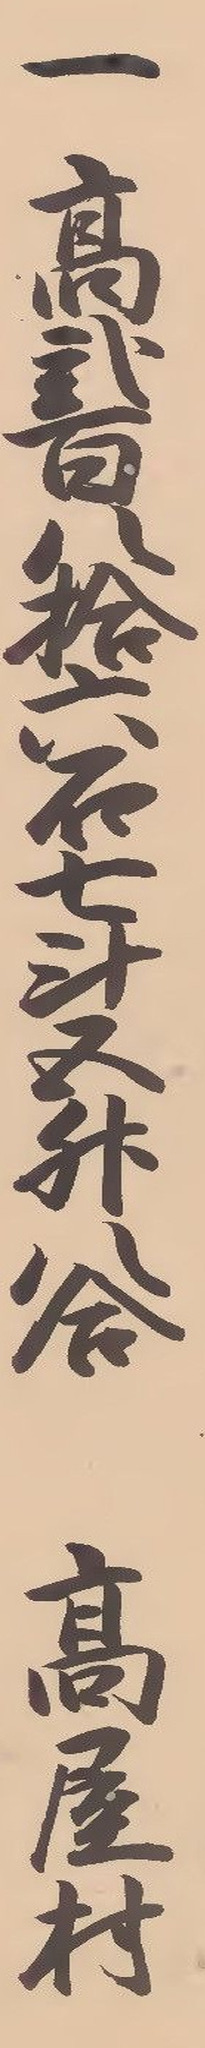一高弐百八拾六石七斗五升八合高屋村
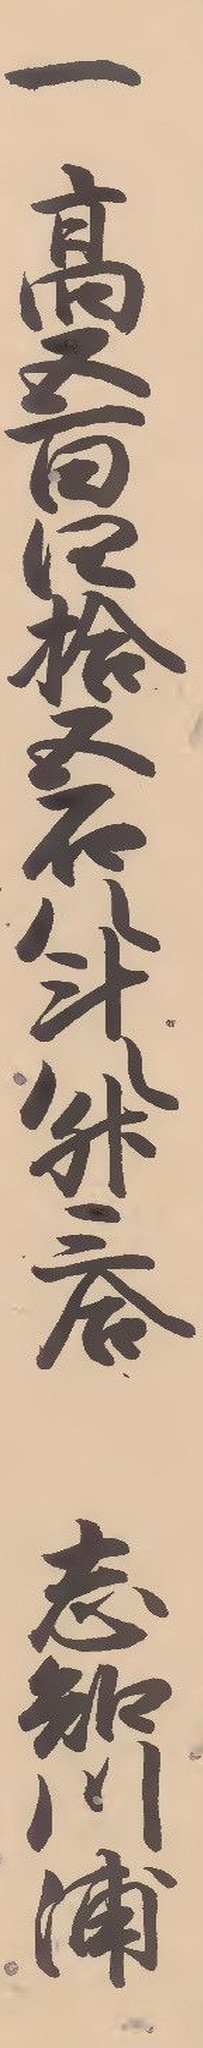一高五百四拾五石八斗八升三合志知川浦
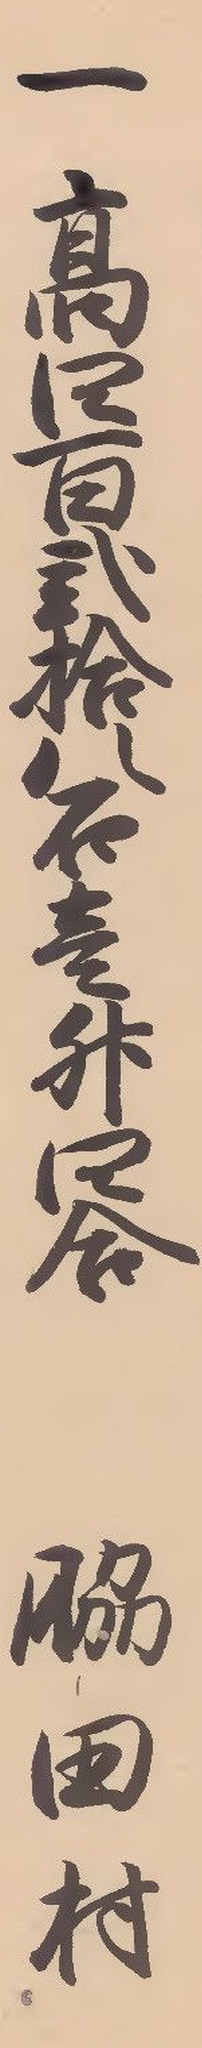一高四百弐拾八石壱升四合脇田村
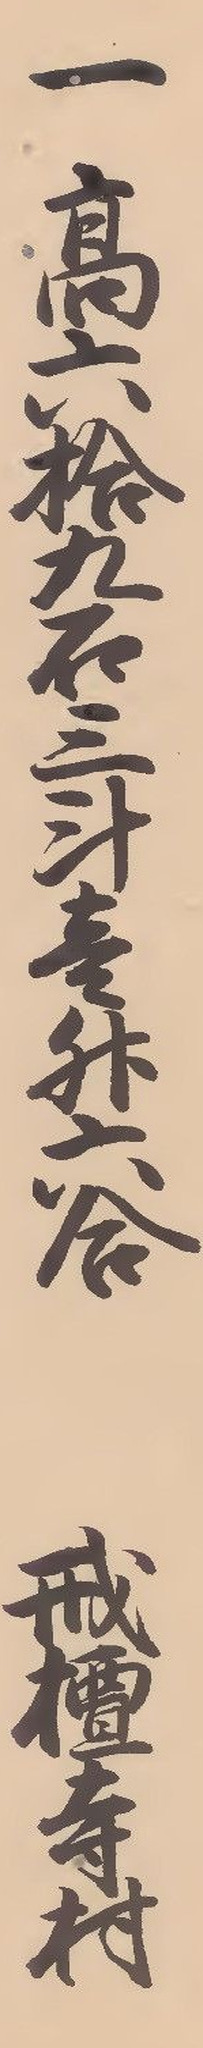一高六拾九石三斗壱升六合戒檀寺村
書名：淡路国郷帳
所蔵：国立公文書館 National Archives of Japan
